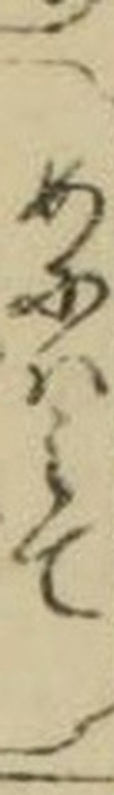めにはみて
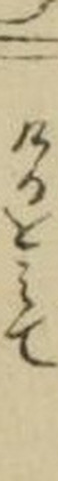けるをみて
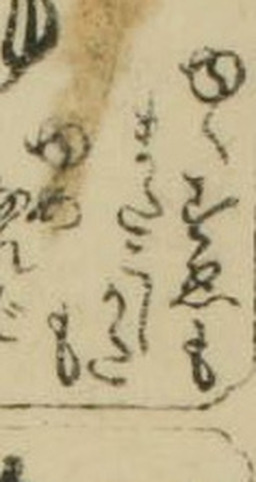またこしかた
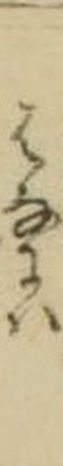はなには
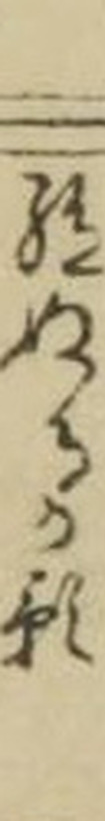絶ぬるか影
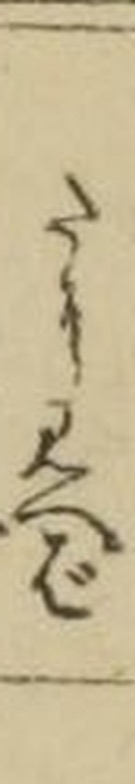たに見へば
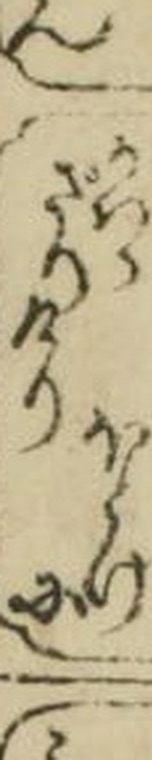なりけり
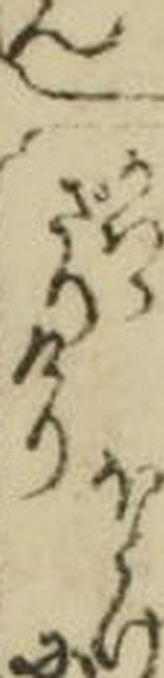なりけり
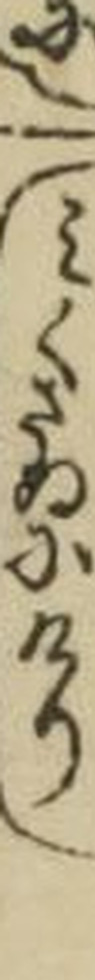みくさゐにけり
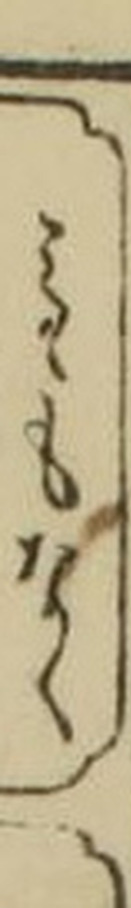目もなく
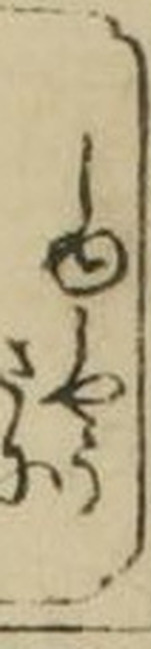しゆしやう
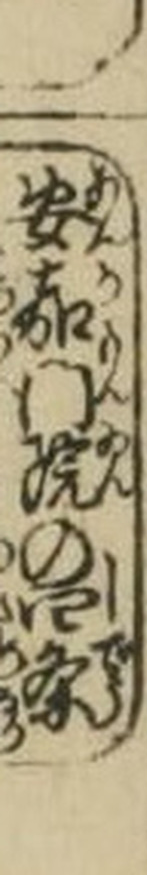安嘉門院の四条
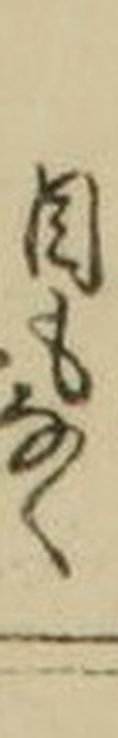目もなく
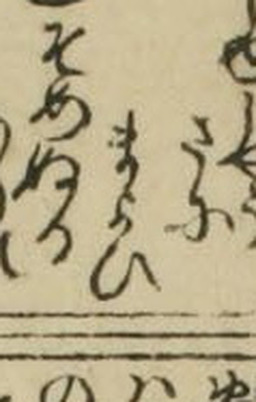まよひ
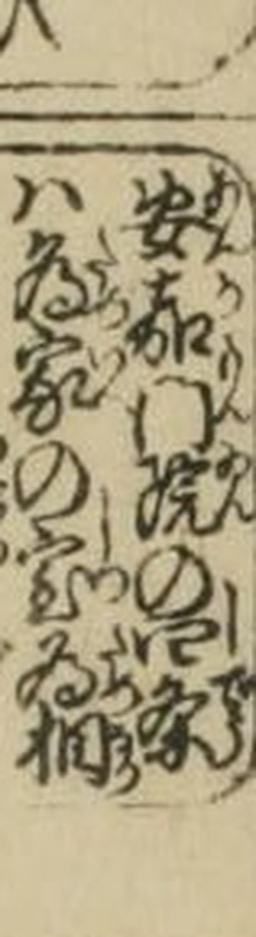は為家の室為相
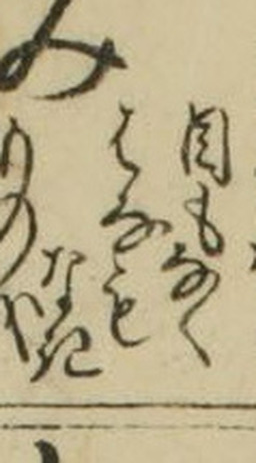はなも
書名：女源氏教訓鑑
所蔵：東京学芸大学附属図書館
